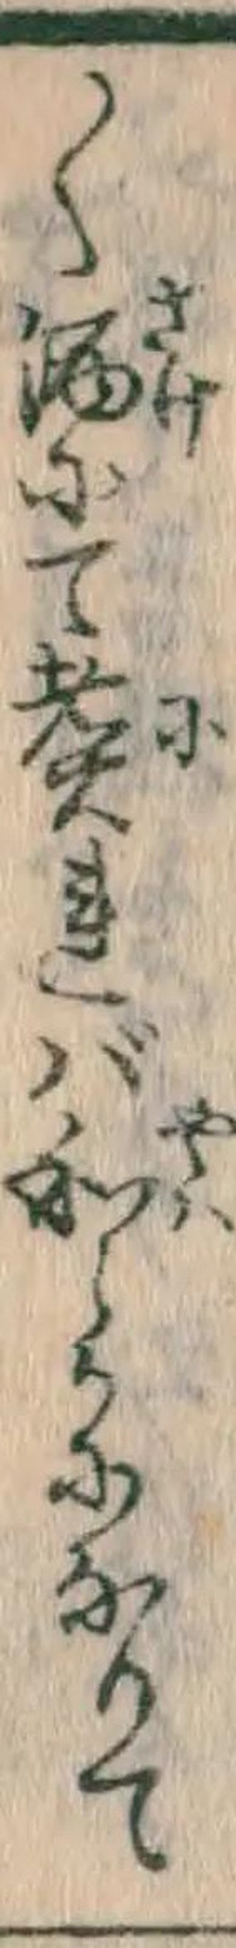〳〵酒にて煮れば和らかになりて
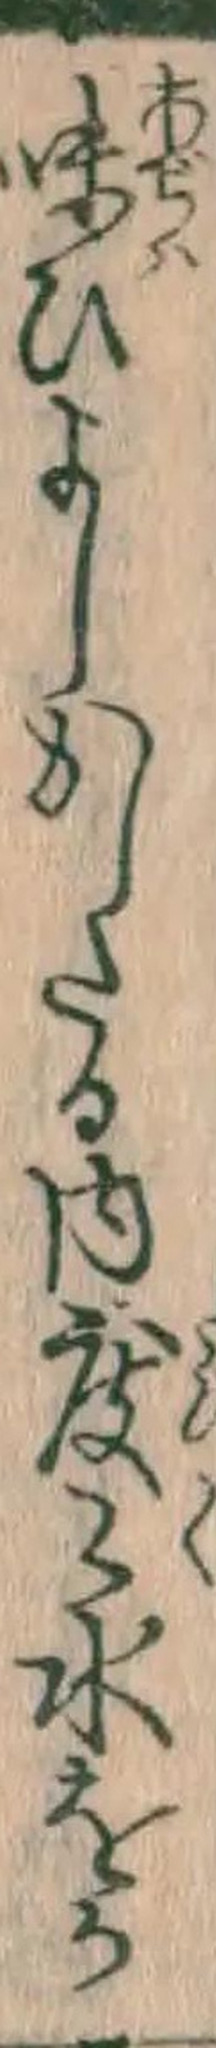味ひよしかしたる内度々水をか
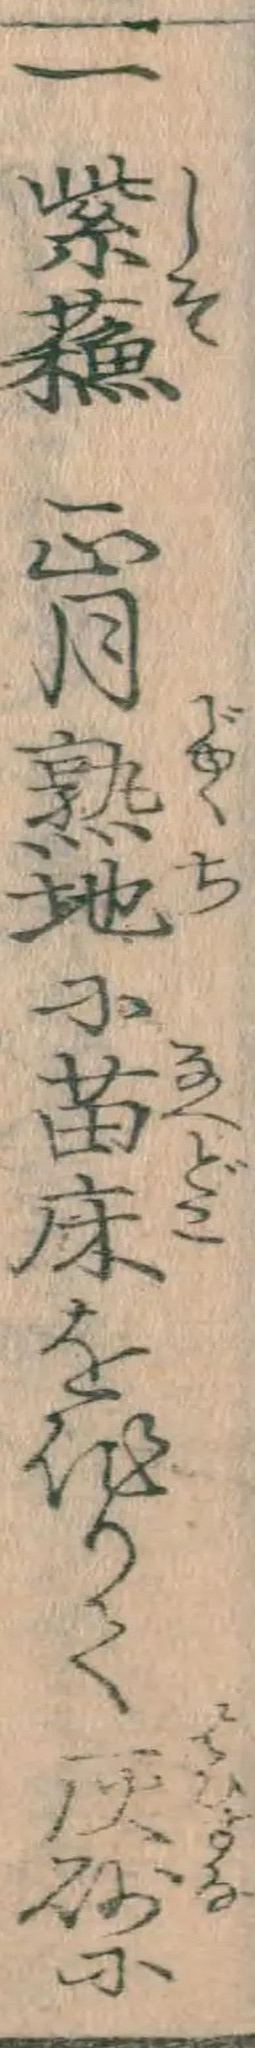一紫蘇正月熟地に苗床を作りて灰砂に
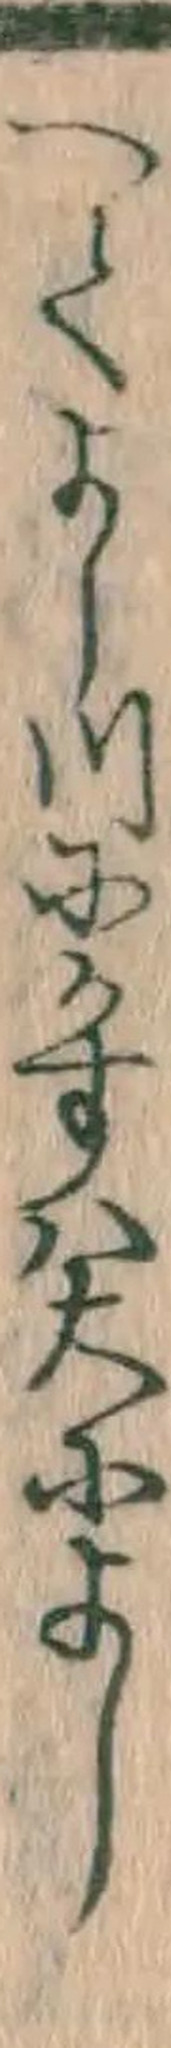へてよし川にかすは大によし
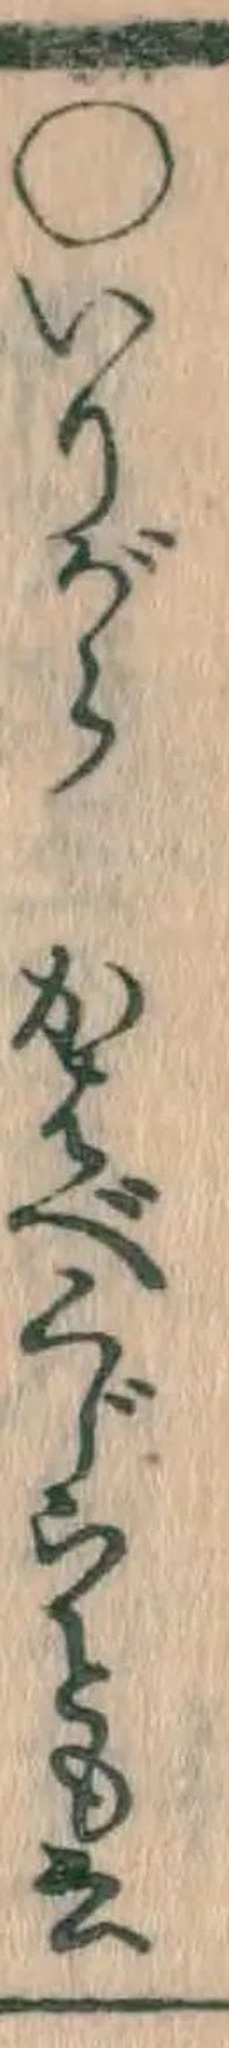○いりがらかはべくじらとも云
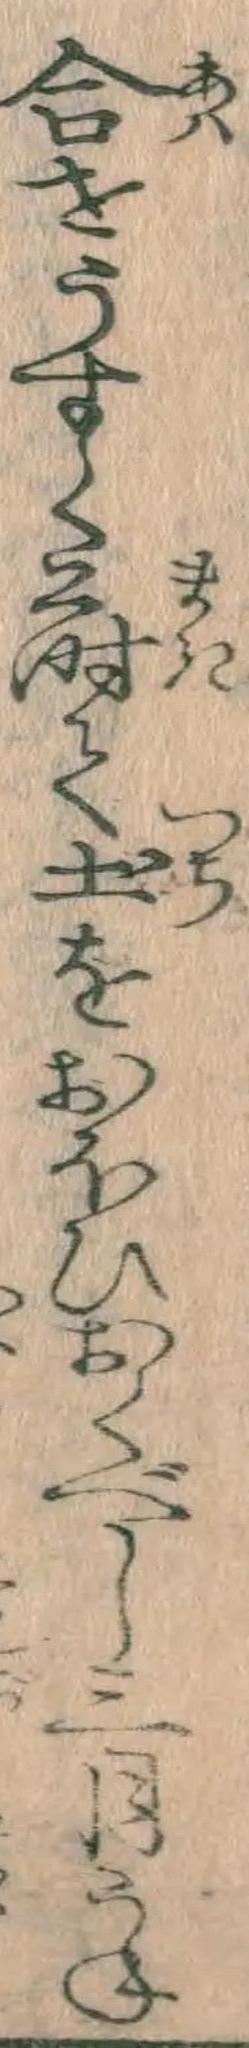合せうすく蒔て土をおほひおくべし三月うね
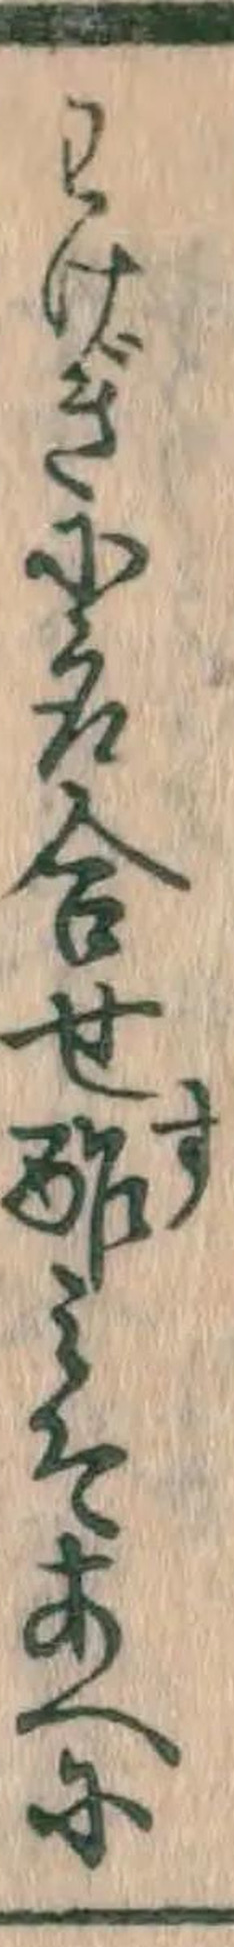わけぎに取合せ酢みそあへに
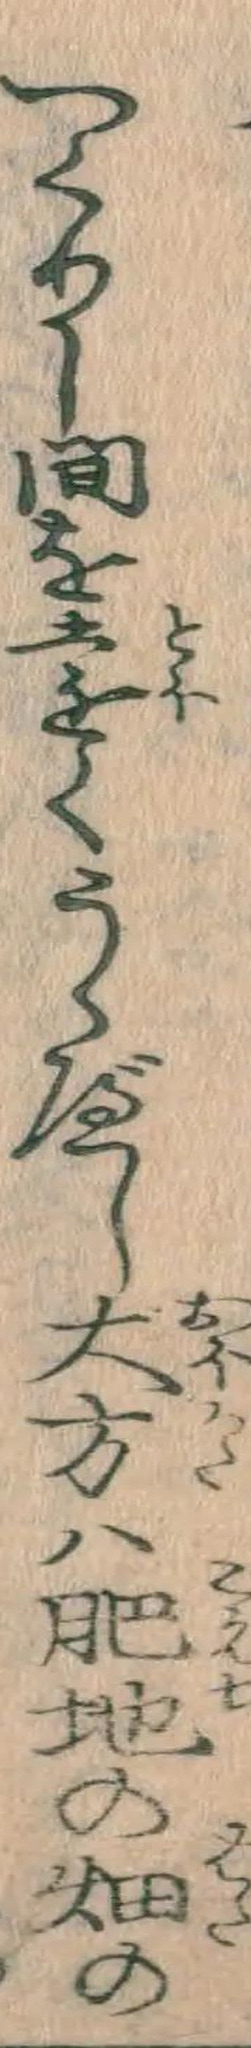つくりし間を遠くうゝべし大方は肥地の畑の
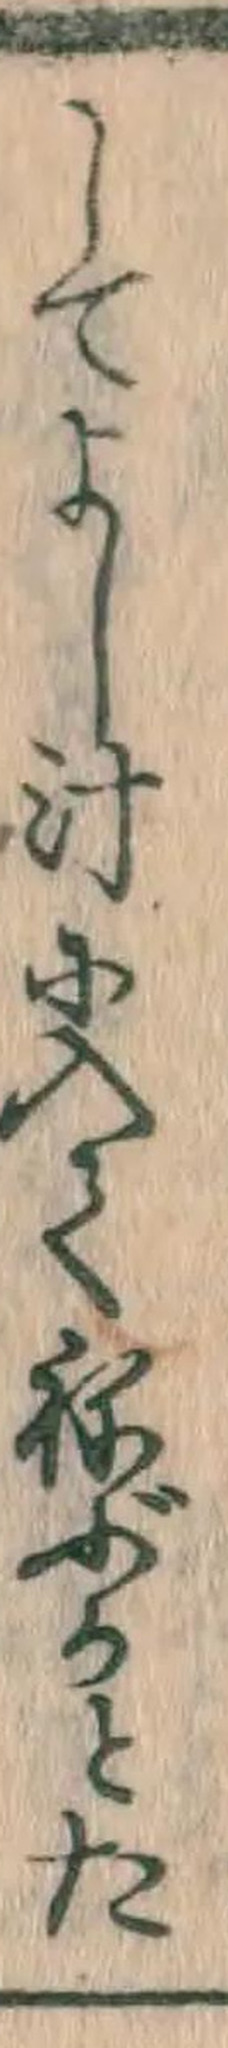してよし汁に入てねぶかとた
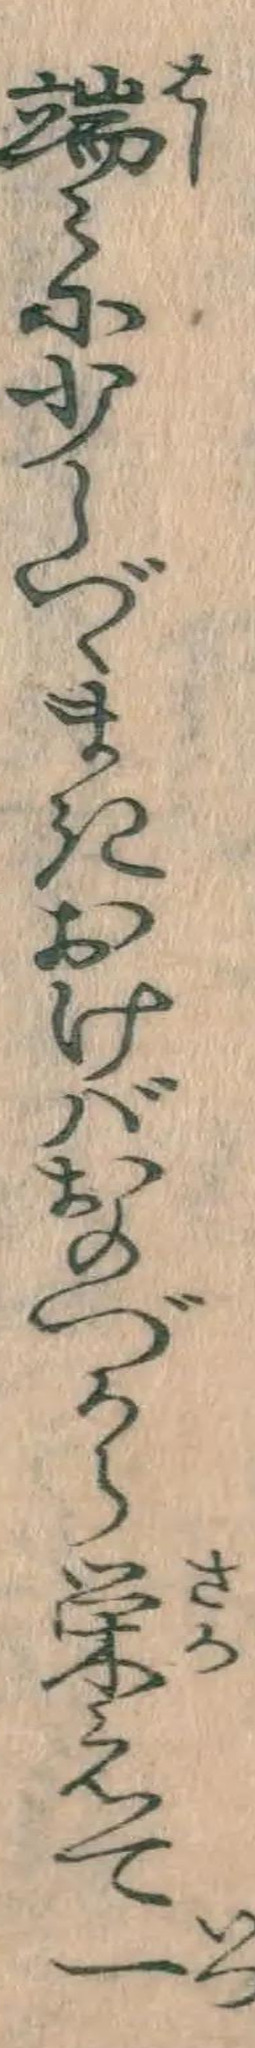端々に少しづゝまきおけばおのづから栄えて一
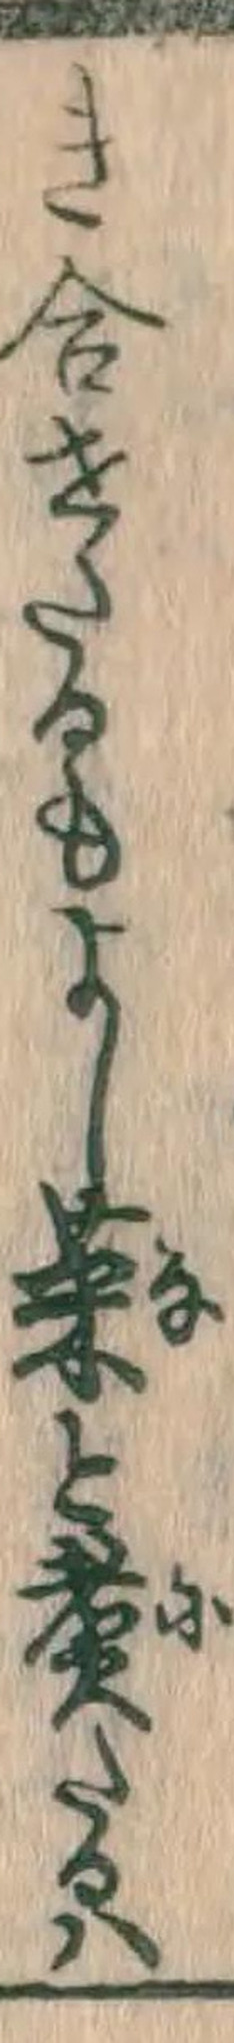き合せたるもよし菜と煮たるは
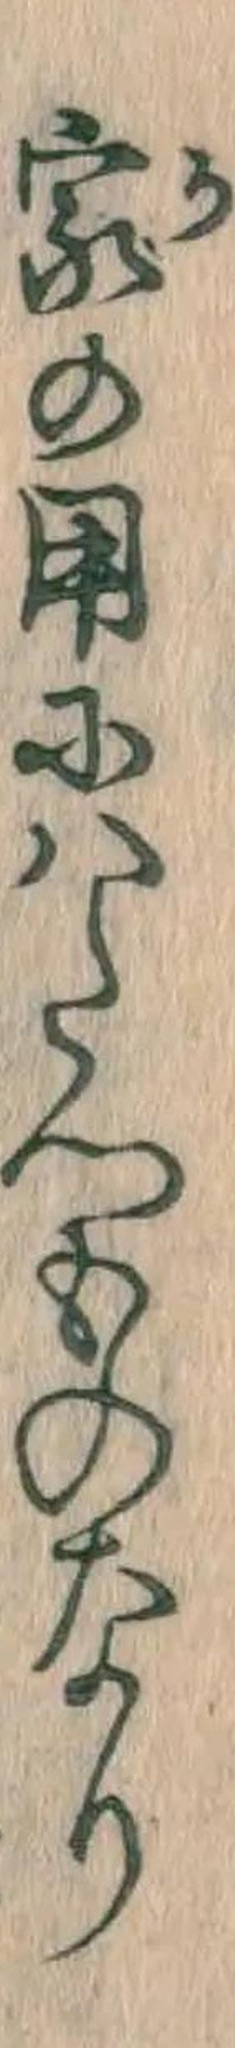家の用にはたつものなり
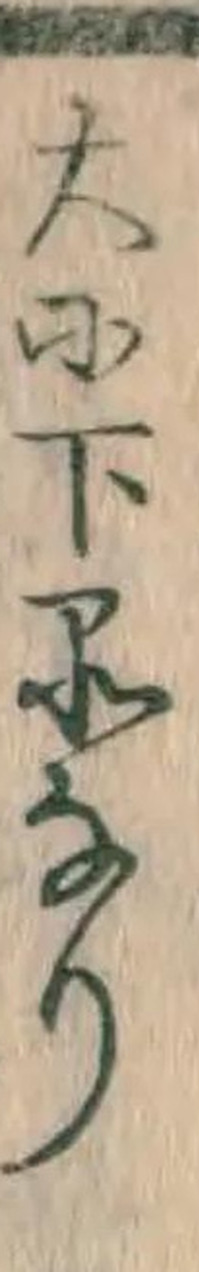大に下品なり
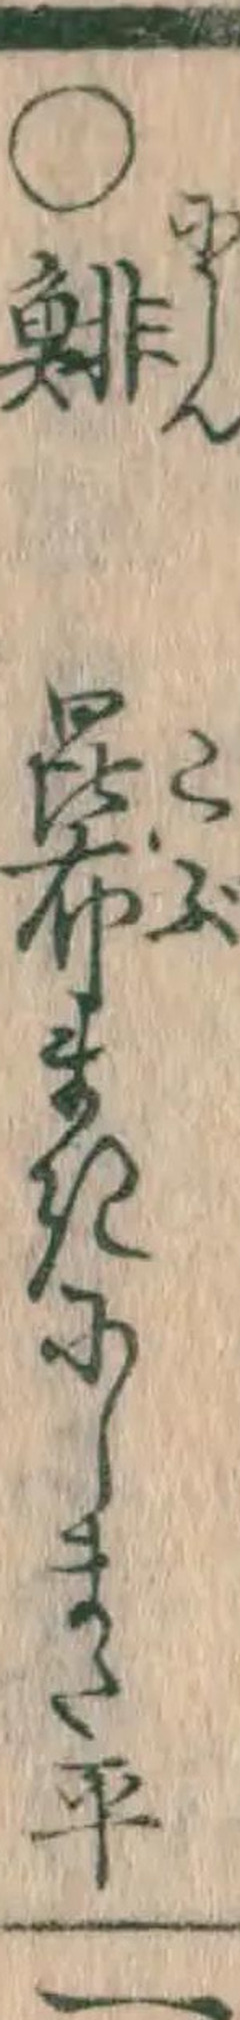○鯡昆布まきにしまた平
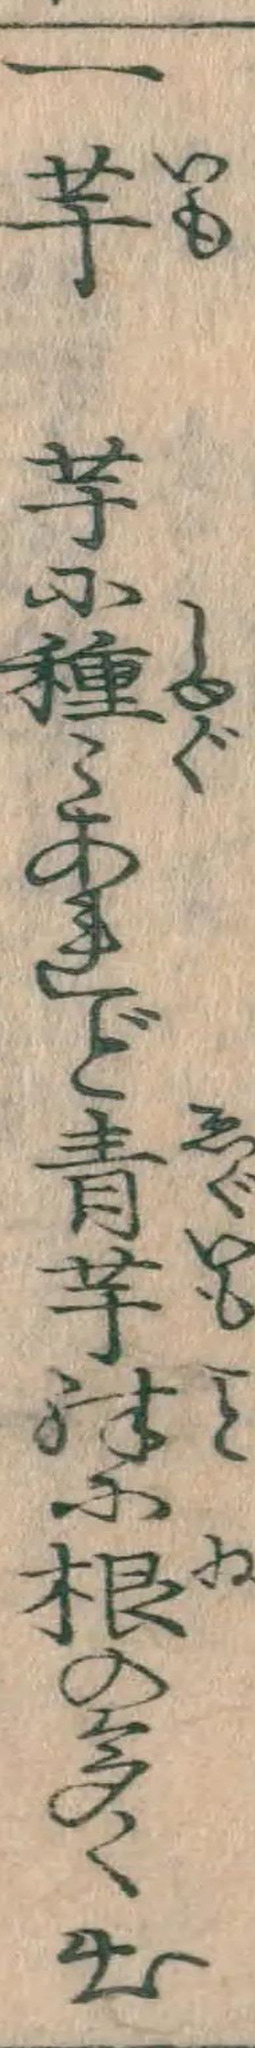一芋芋に種々あれど青芋殊に根の多く出
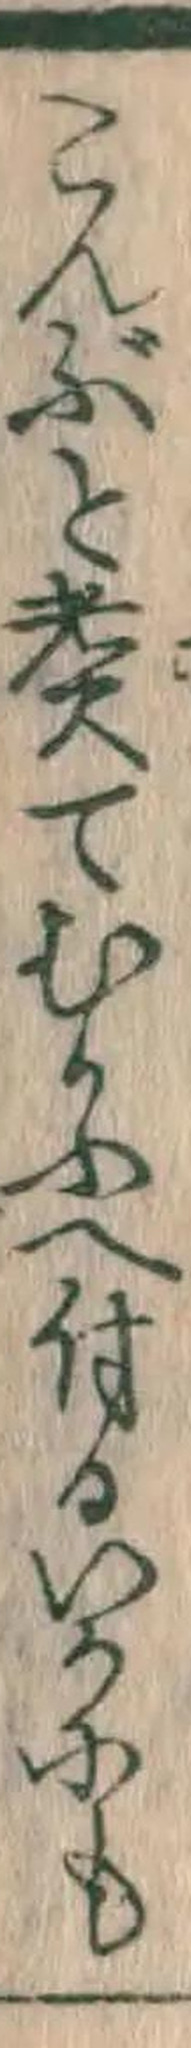こんぶと煮てむかふへ付るいかにも
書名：広益秘事大全 3巻. [5]
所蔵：国立国会図書館 National Diet Library, JAPAN
